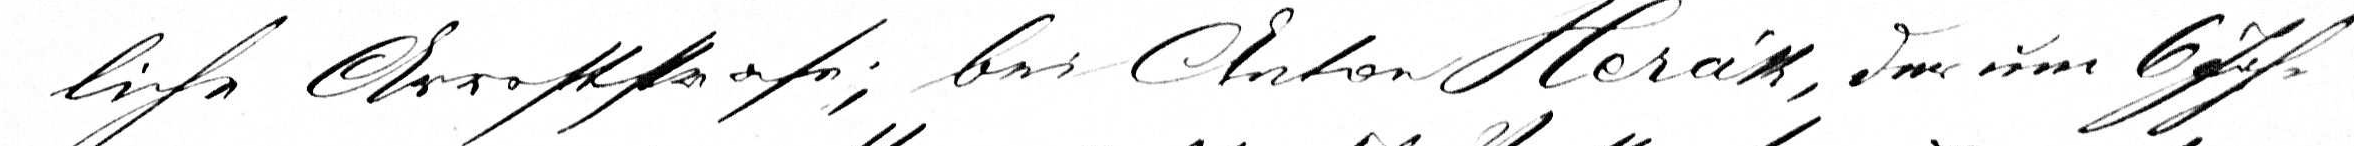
liche Arreststrafe; bei Anton Herák, der um 6Jah¬
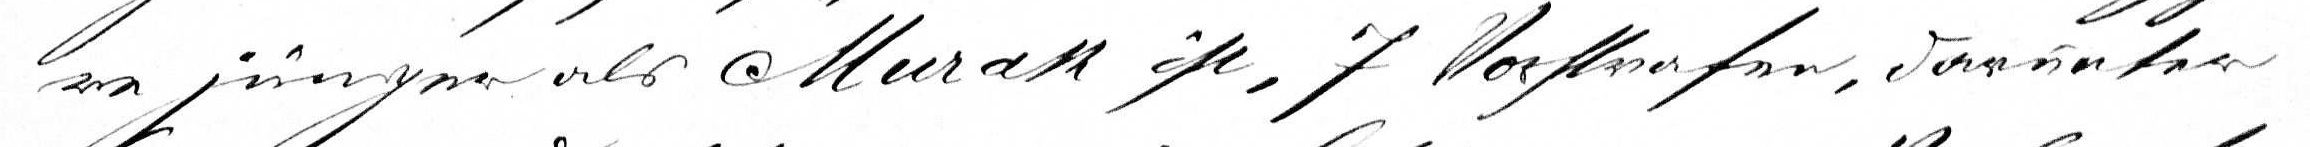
re jünger als Murak ist, 7 Vorstrafen, darunter
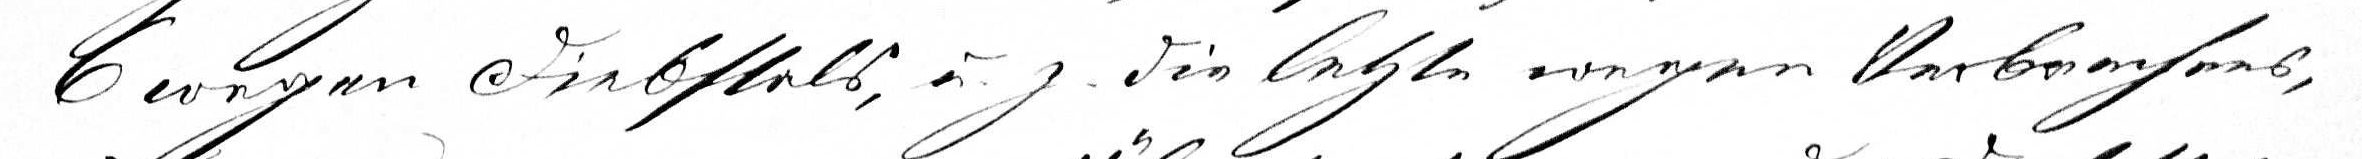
6 wegen Diebstals, u.z. die letzte wegen Verbrechens,
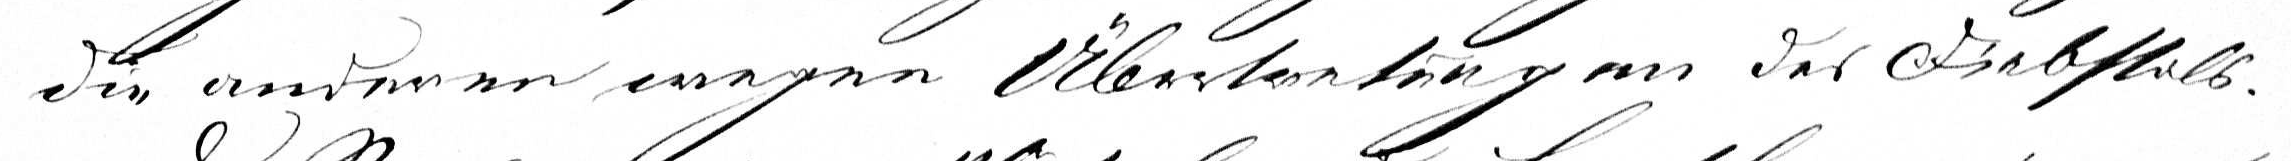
die anderen wegen Übertretung an der Diebstals.
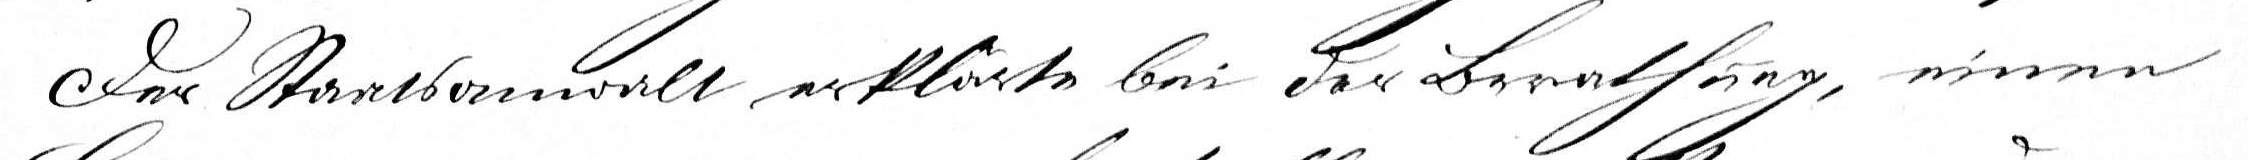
Der Staatsanwalt erkluarte bei der Berathung, einen
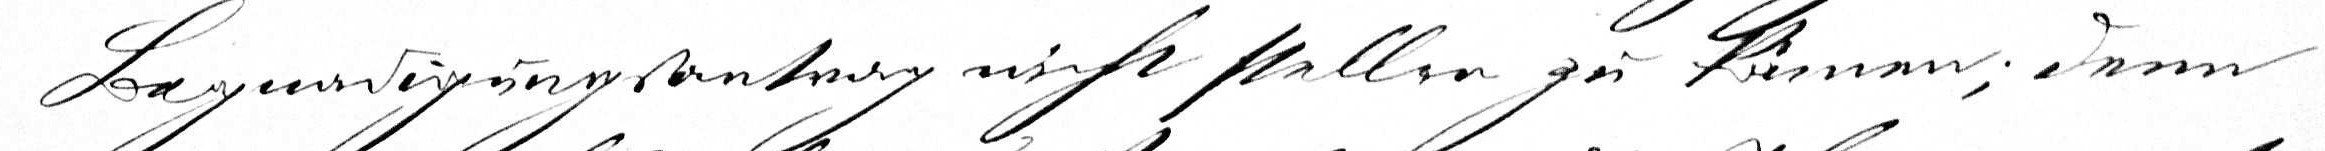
Begnadigungsantrag nicht stellen zu können; denn
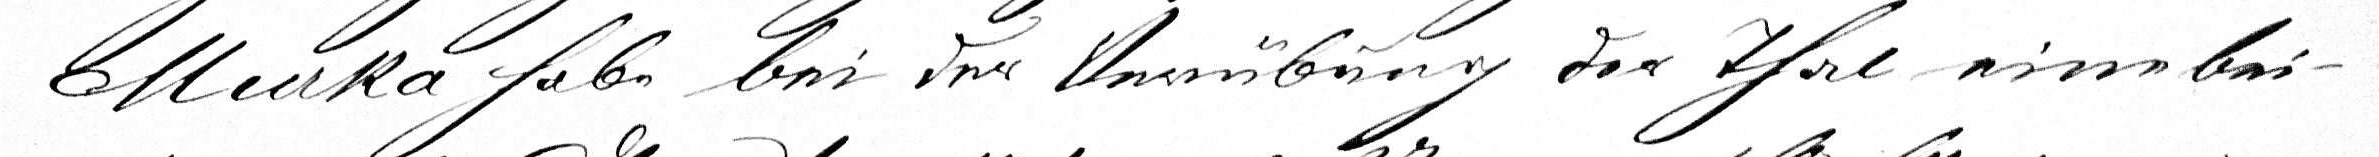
Murka habe bei der Verübung der That eine bei¬
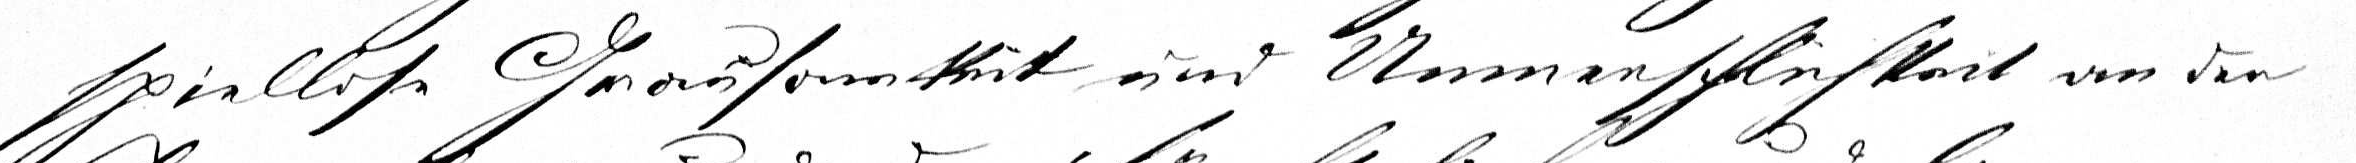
spiellose Grausamkeit und Unmenschlichkeit an den
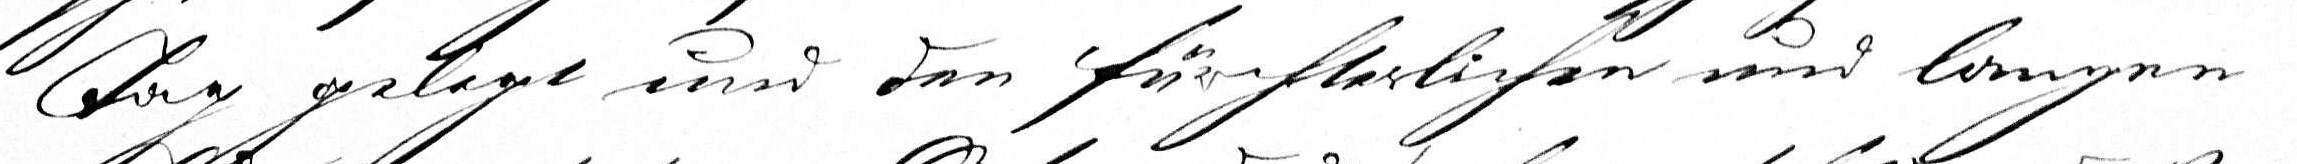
Tag gelegt und den fürchterlichen und langen
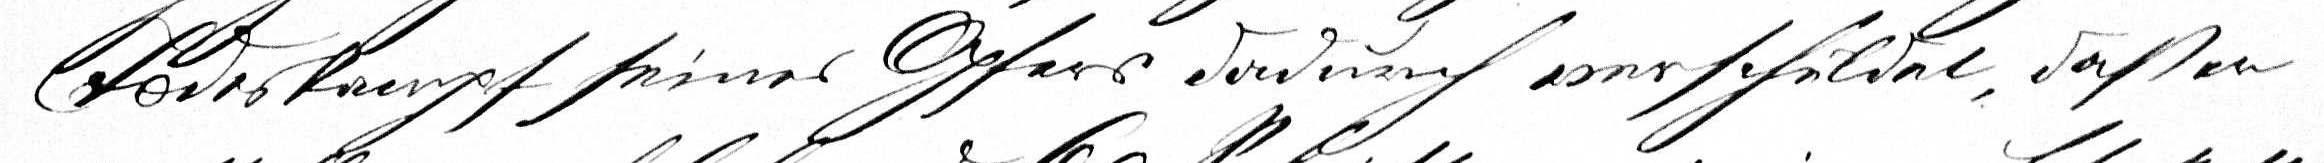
Todeskampf seines Opfers dadurch verschildet, daß er
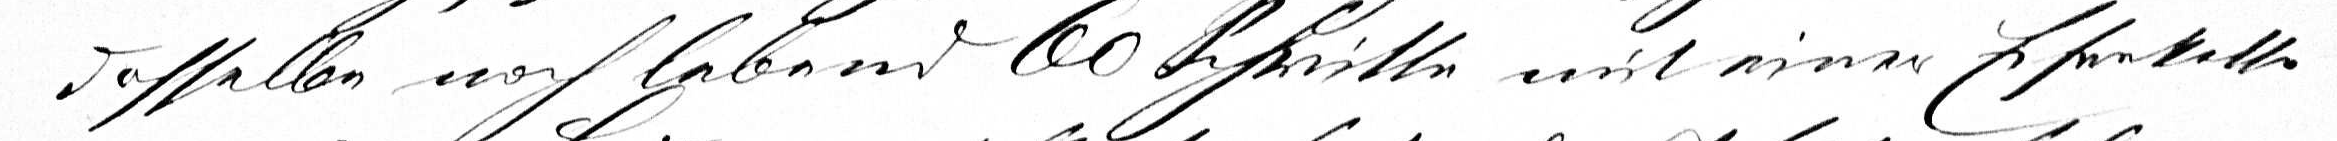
dasselbe noch lebend 60 Schritte mit einer Eisenkette
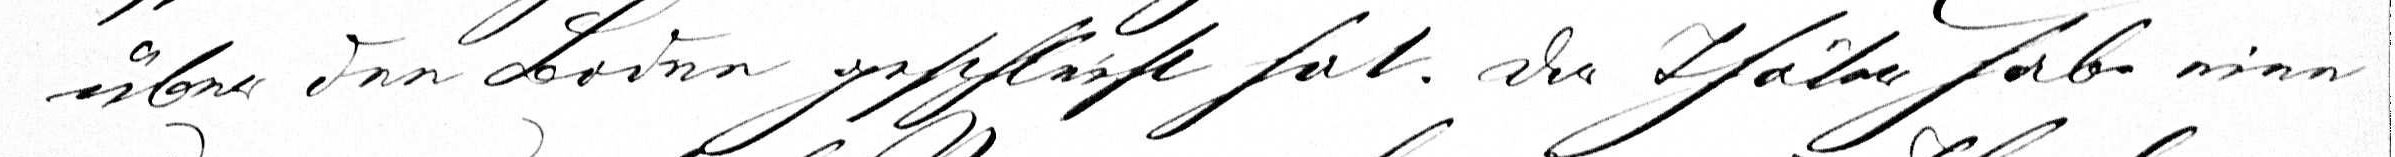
über den Boden geschleift hat. Der Thäter habe eine
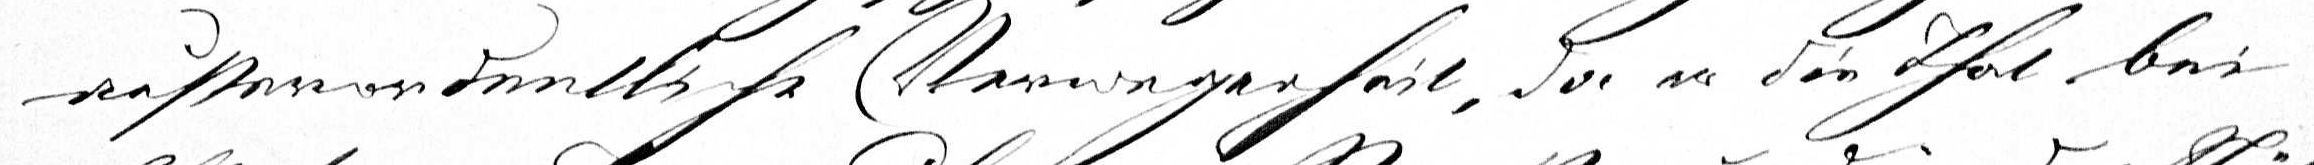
außerordentliche Verwegenheit, das er die That bei
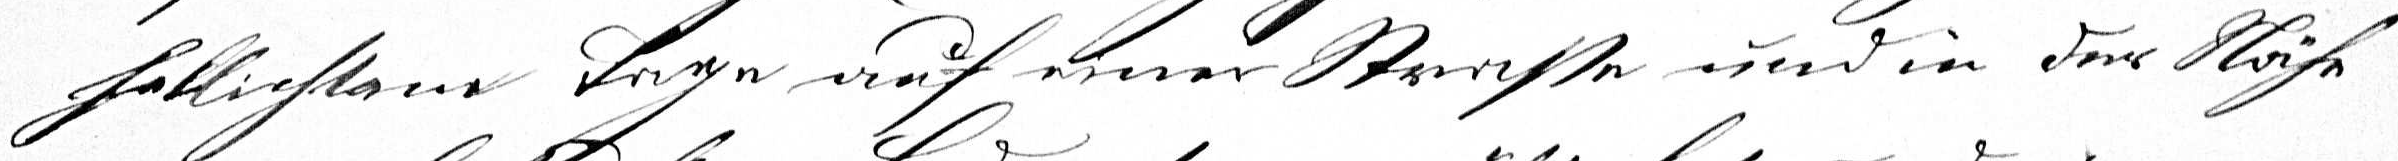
hellichtem Tage auf einer Straße und in der Nähe
